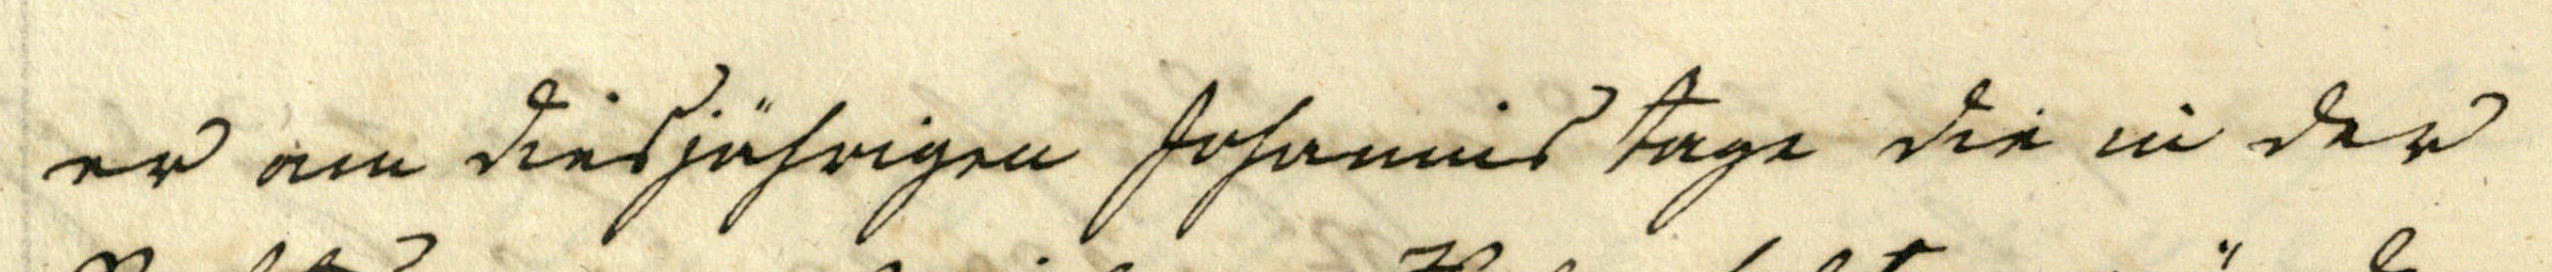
er am diesjährigen Johannis Tage die in der
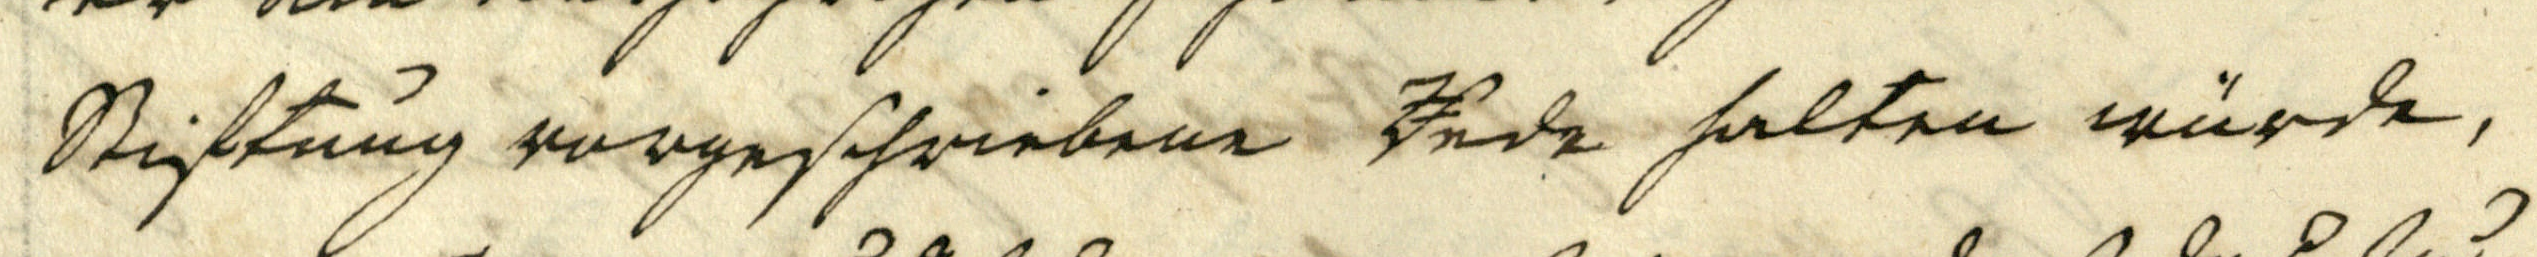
Stiftung vorgeschriebene Rede halten würde,
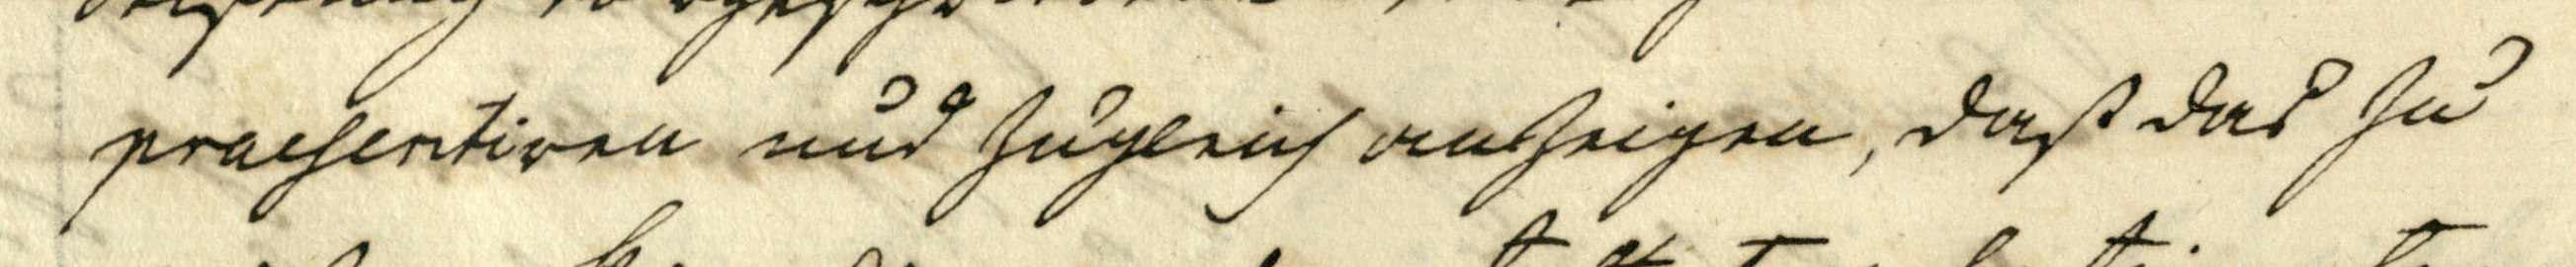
praesentiren und zugleich anzeigen, daß das zu
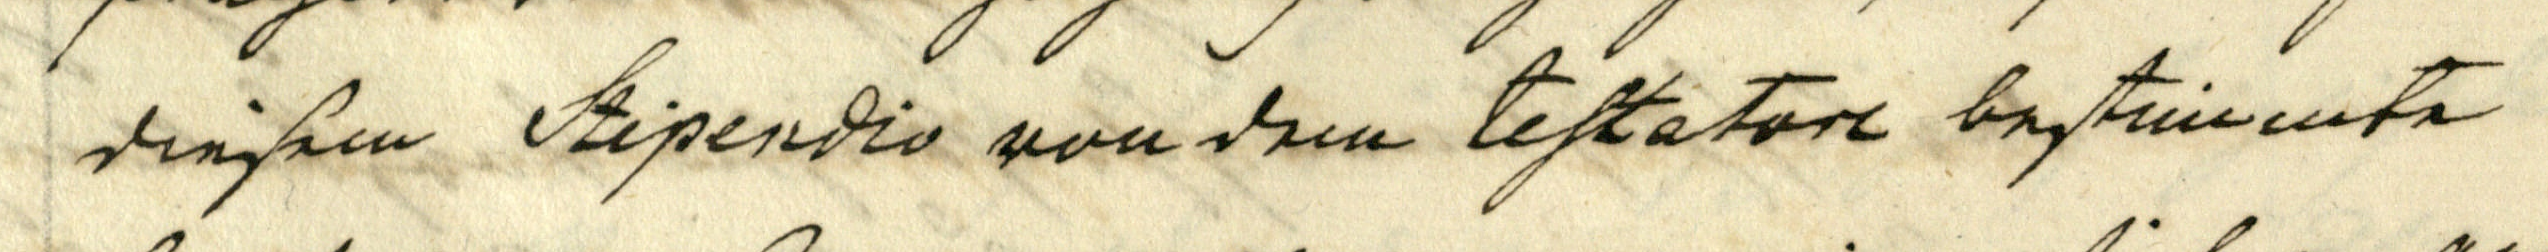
diesem Stipendio von dem Testatore bestimmte
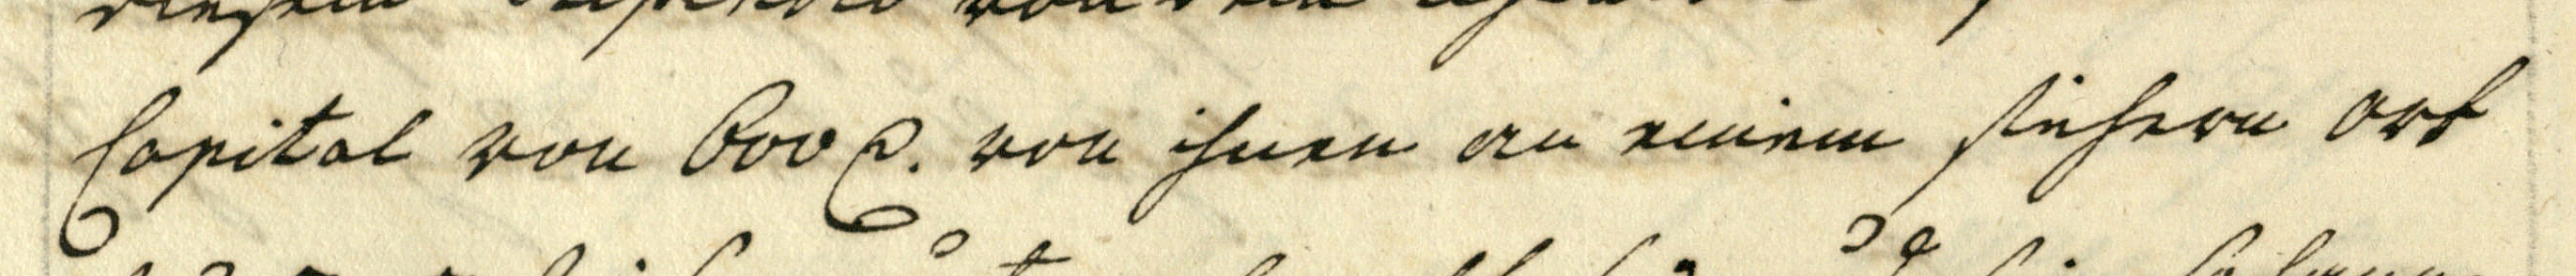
Capital von 600 l. von ihnen an einem sichern Ort
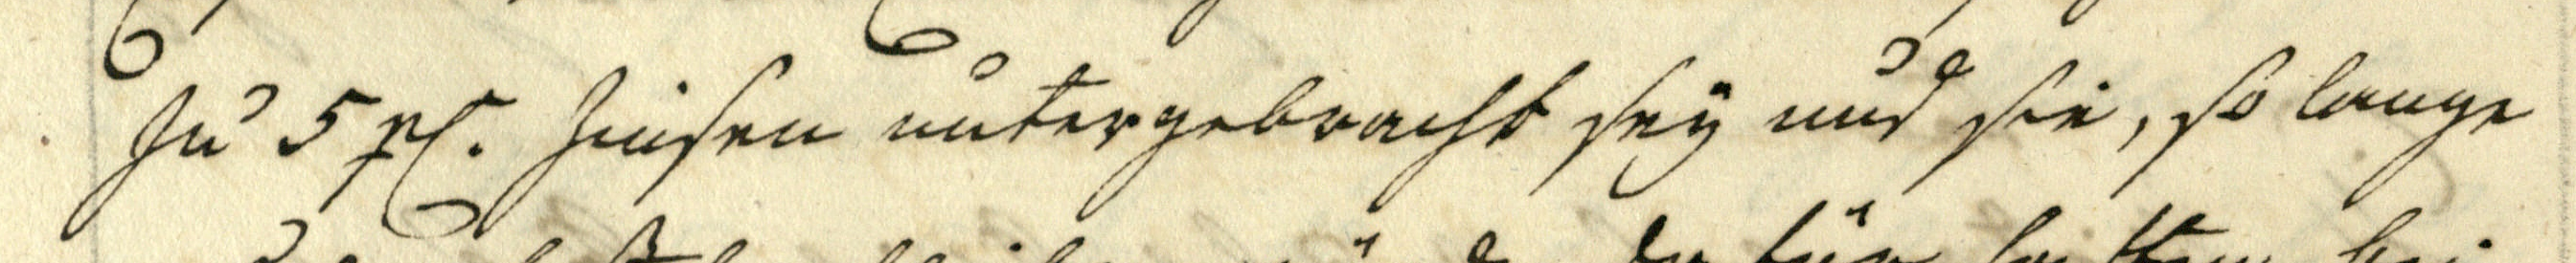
zu 5 pl. Zinsen untergebracht seÿ und sie, so lange
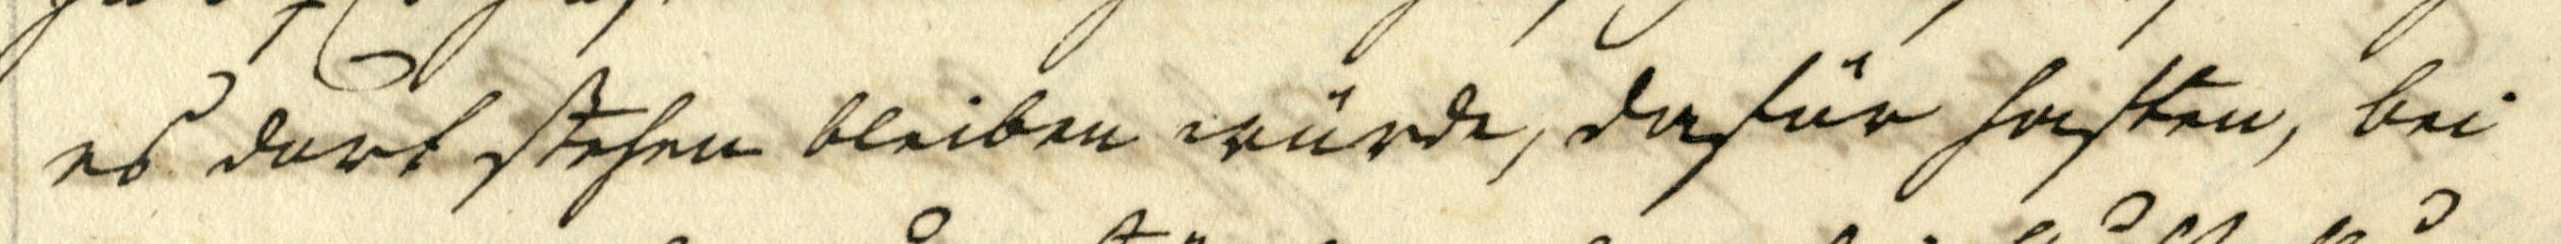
es dort stehen bleiben würde, dafür haften, bei
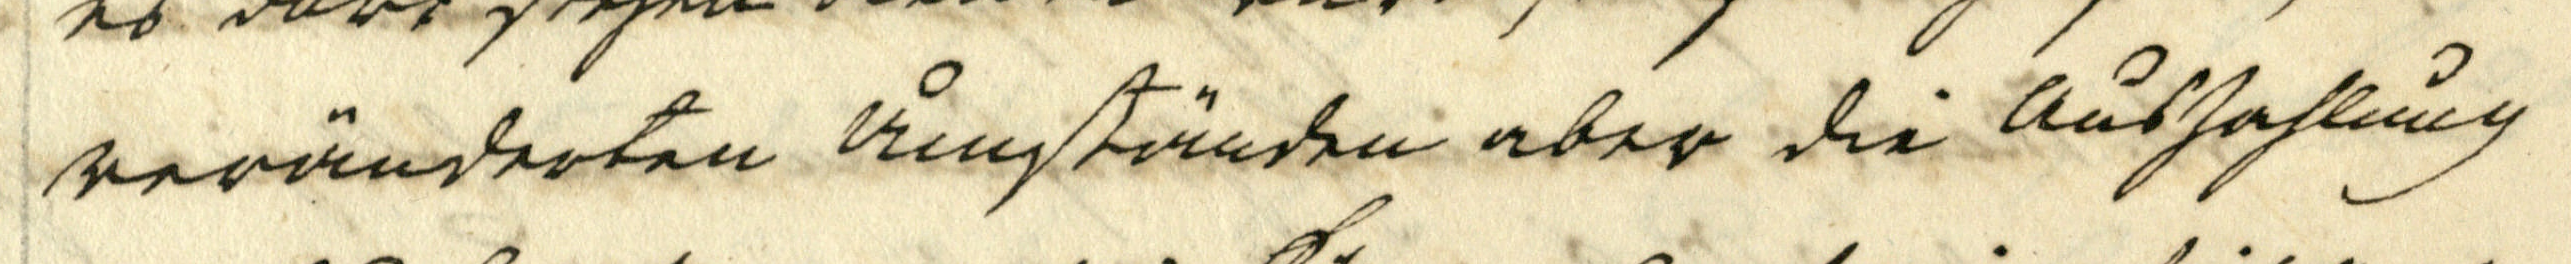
veränderten Umständen aber die Auszahlung
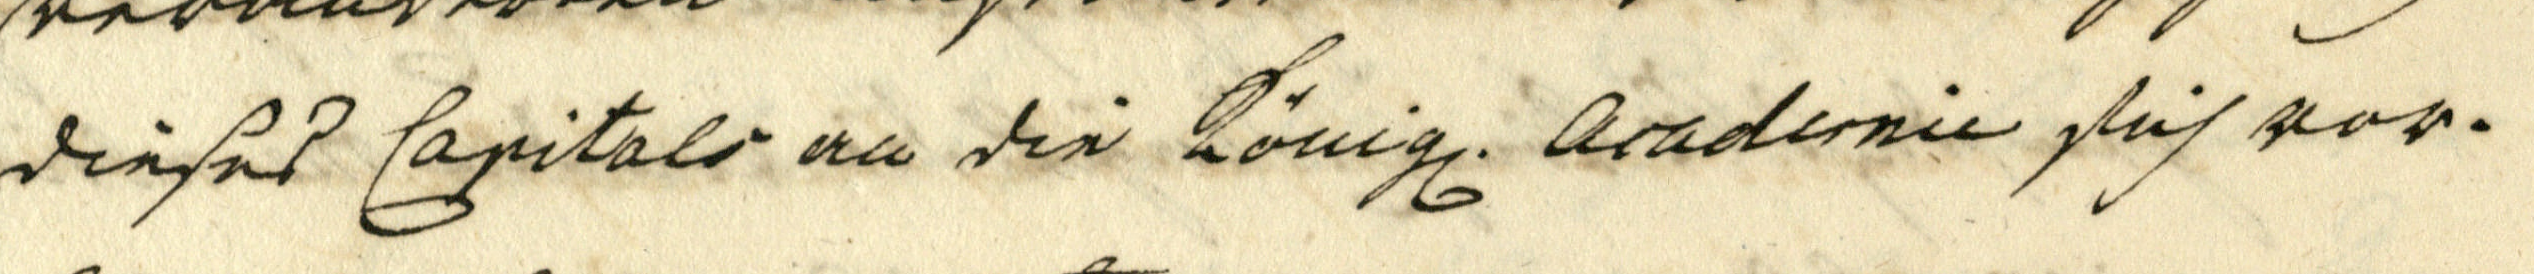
dieses Capitals an die Königl. Academie sich vor¬
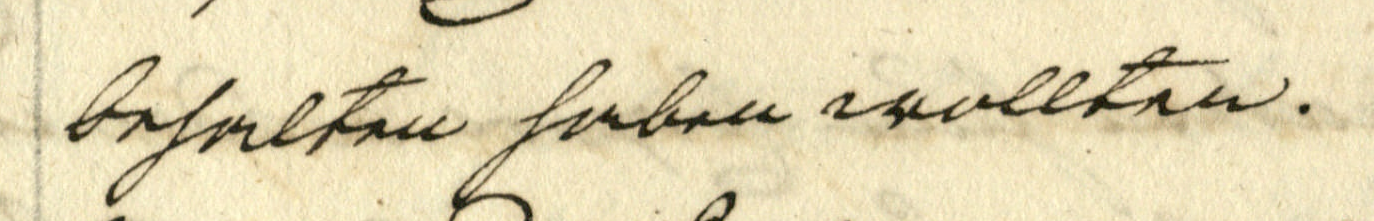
behalten haben wollten.
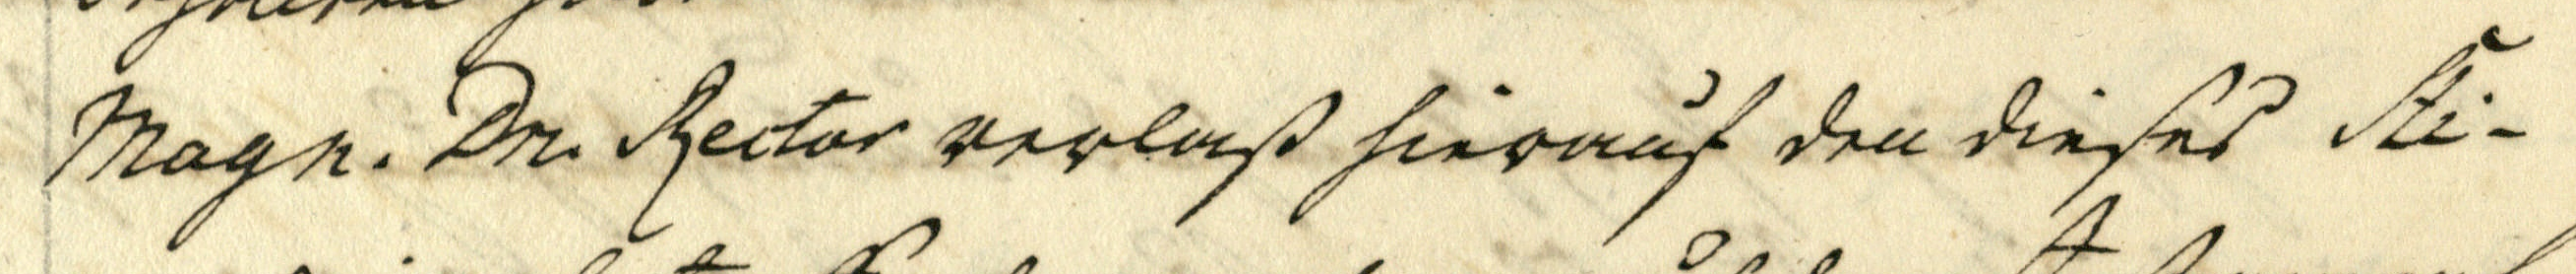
Magn. Dn. Rector verlaß hierauf den dieses Sti¬
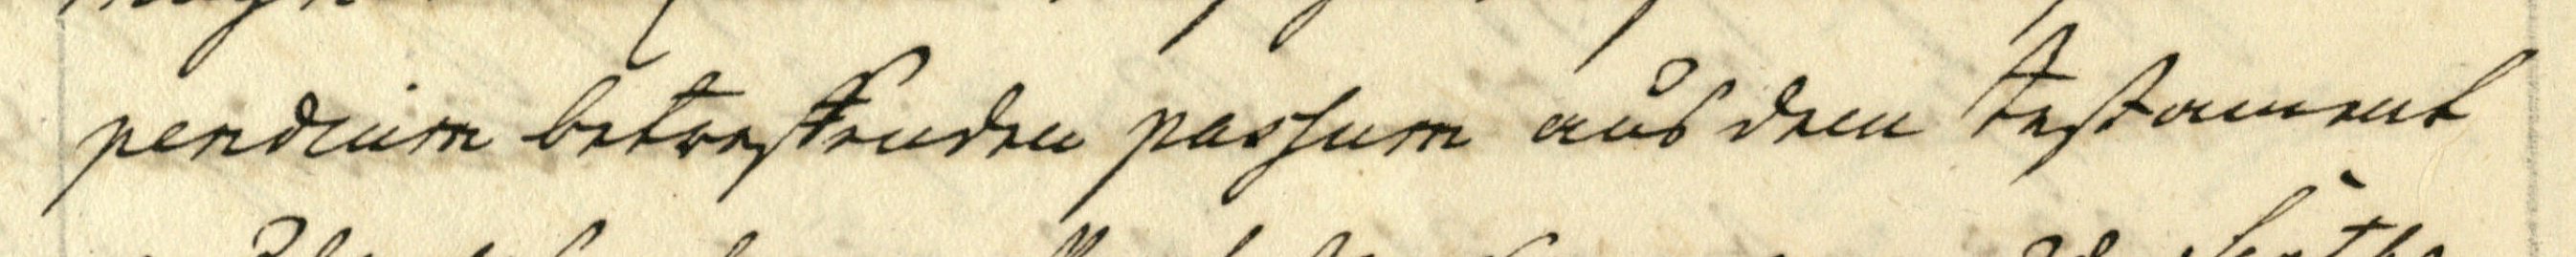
pendium betreffenden passum aus dem Testament
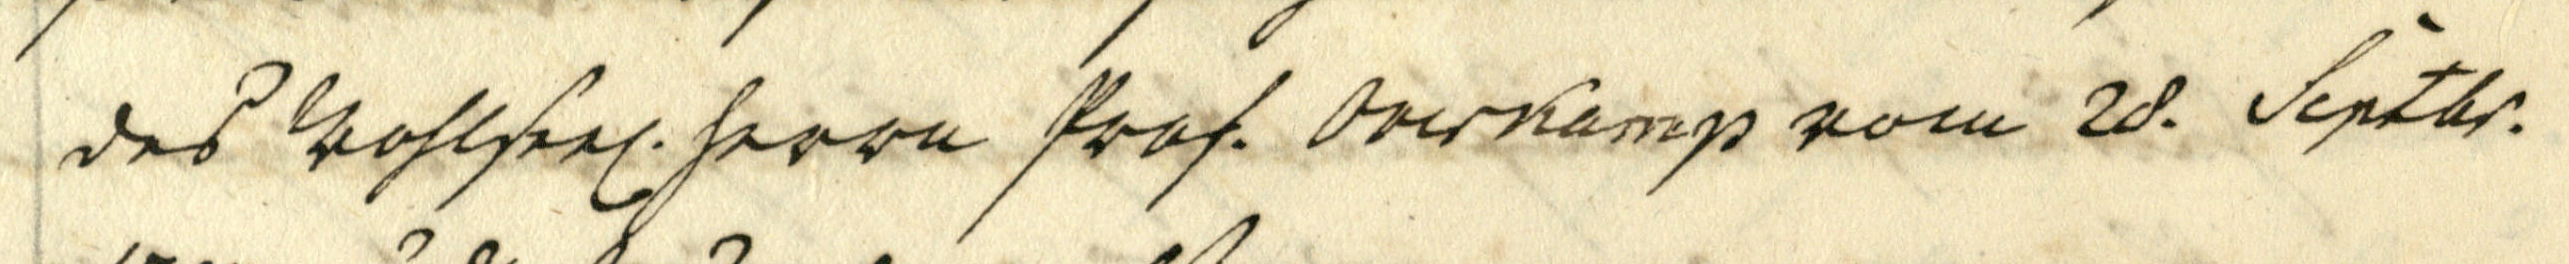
des Wohlseel. Herrn Prof. Overkamp vom 28. Septbr.
